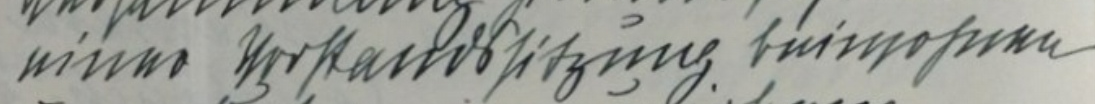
einer Vorstandsitzung beiwohnen
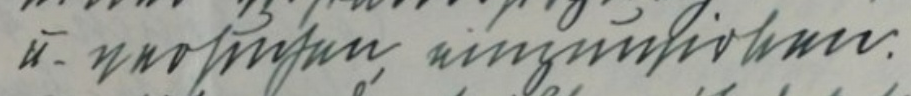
u. versuchen einzuwirken.
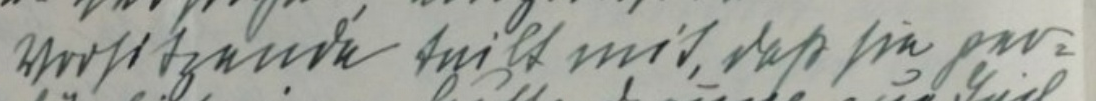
Vorsitzende teilt mit, da0 sie per
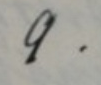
9.
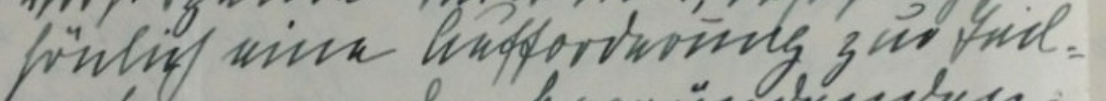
sönlich eine Aufforderung zur Teil
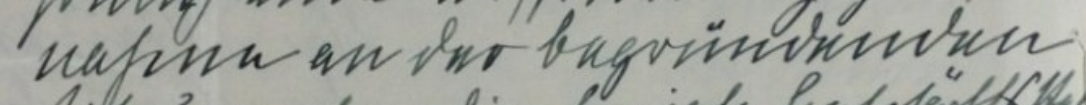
nahme an der begründenden
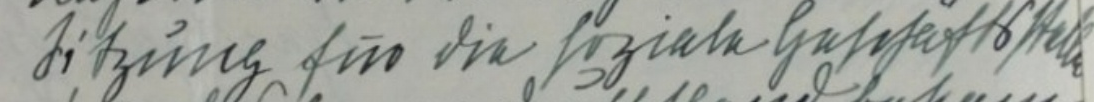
Sitzung für die Soziale Geschäftsstelle
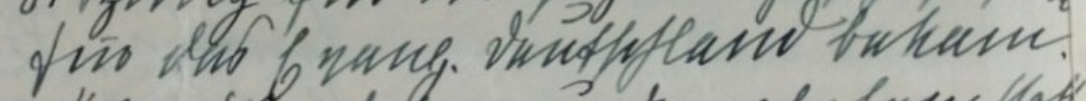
für das Evang. Deutschlang bekam.
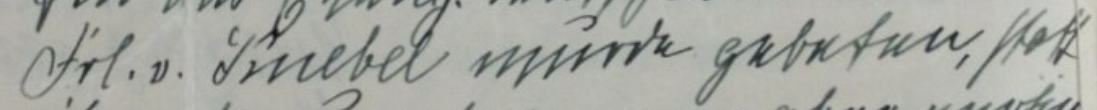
Frl. v. Imebel wurde gebeten statt
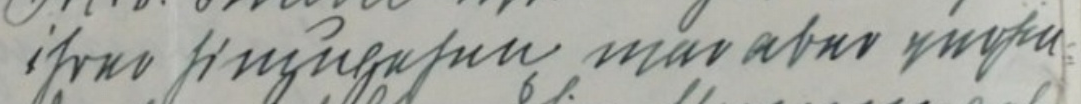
iherer hinzugehen war aber verhin
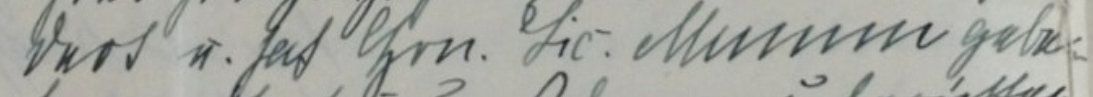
dert u hat Hrn. Lic. Mumm gebe
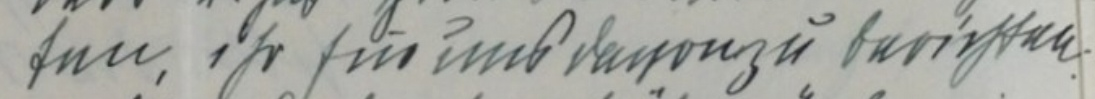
ten, ihr für uns davon zu beichten
